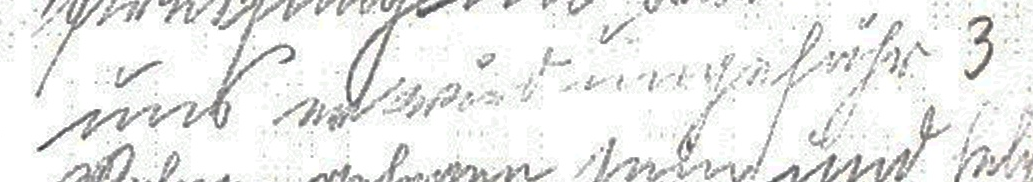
und wird ungefähr 3
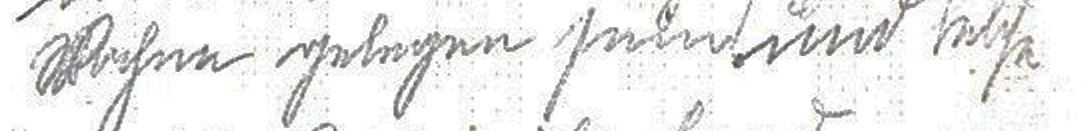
Wochen gelegen sein und lebte
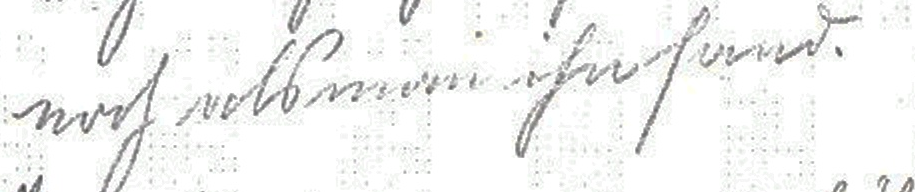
noch als man ihn fand.
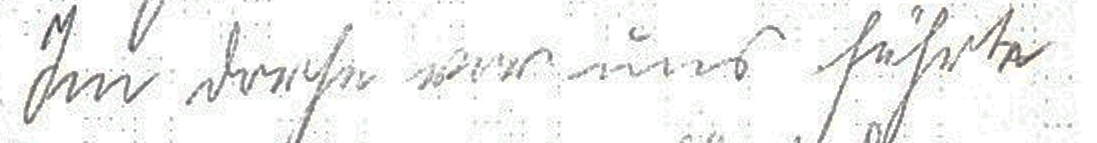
Im Dorfe vor uns führte
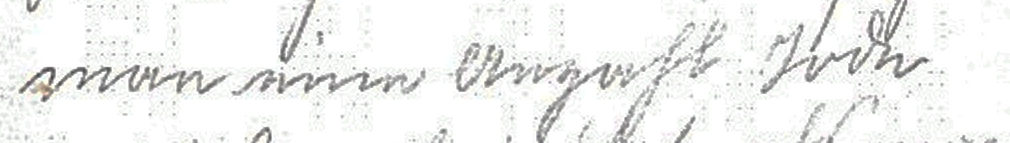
man eine Anzahl Juden
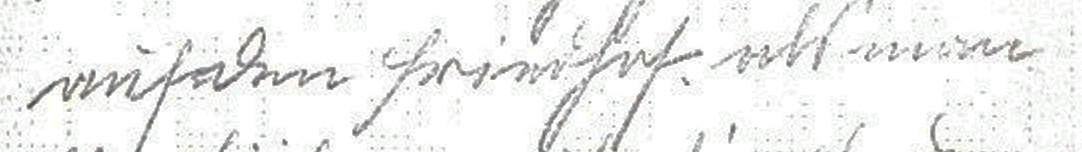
auf den Friedhof als man
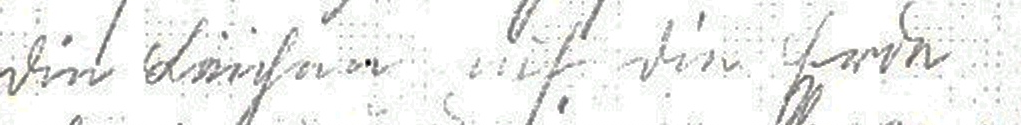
die Leichen auf die Erde
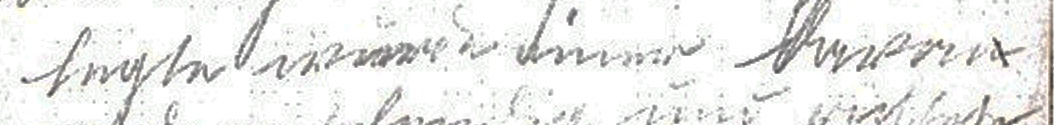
legte wurde einer davon
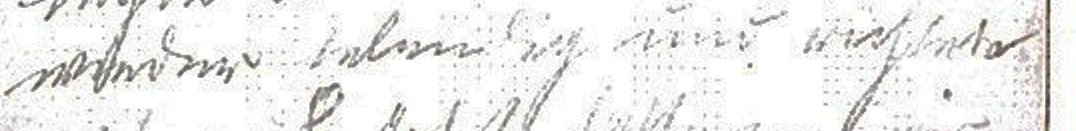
wieder lebendig und richtete
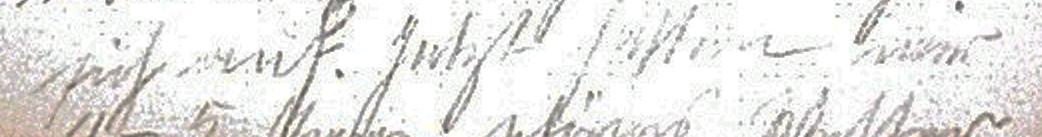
sich auf. Jetzt hatten wir
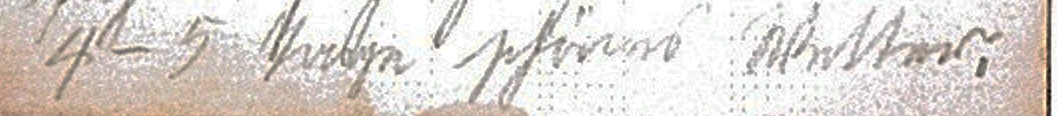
4-5 Tage schönes Wetter.
